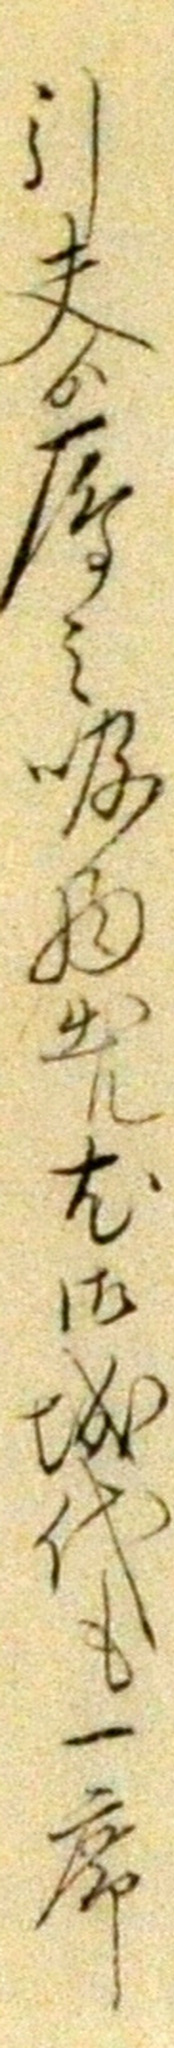引夫ゟ雁之吸物出ル尤御城代も一席
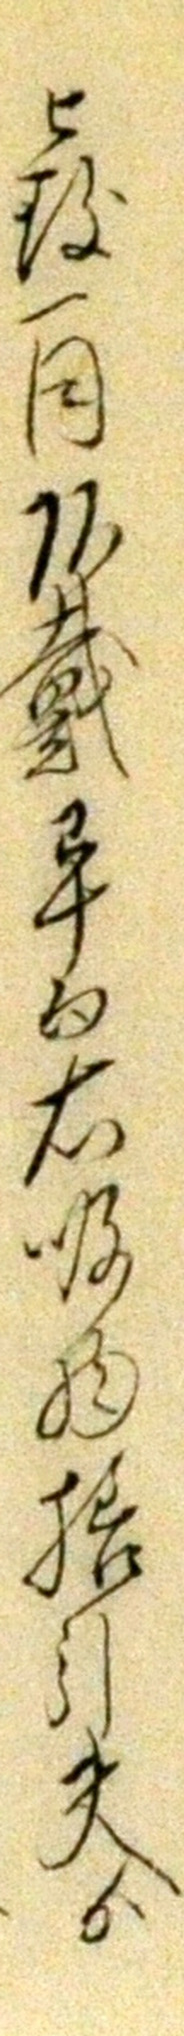被致一同頂戴畢而右吸物膳引夫ゟ
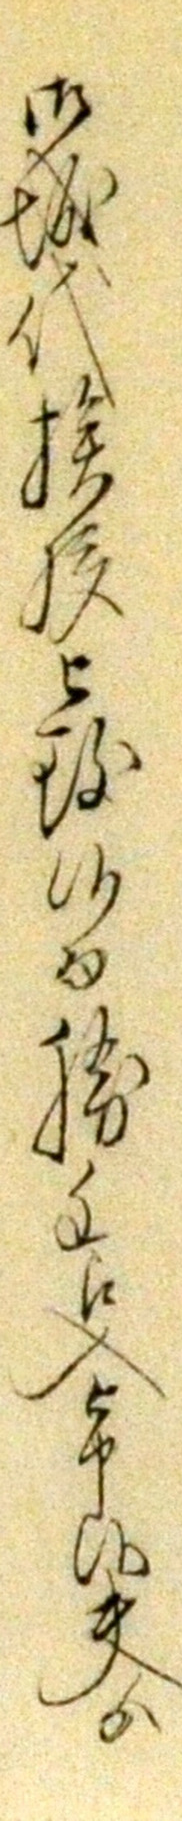御城代挨拶被致候而勝手え入被申候夫ゟ
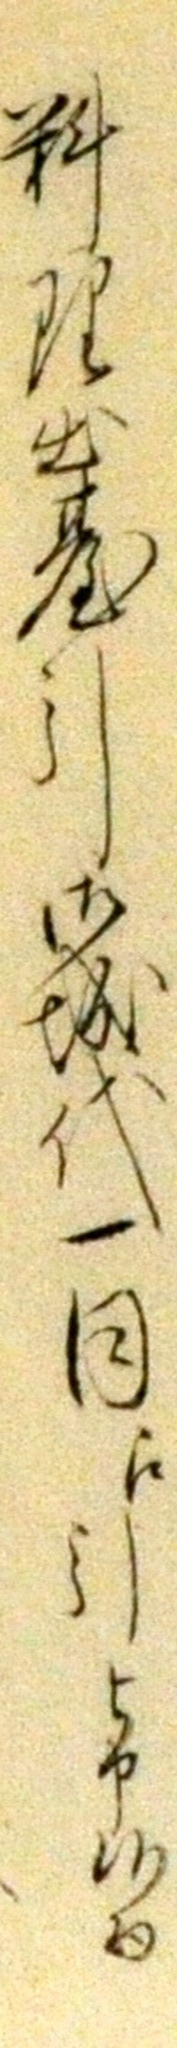料理出台引御城代一同え引被申候而
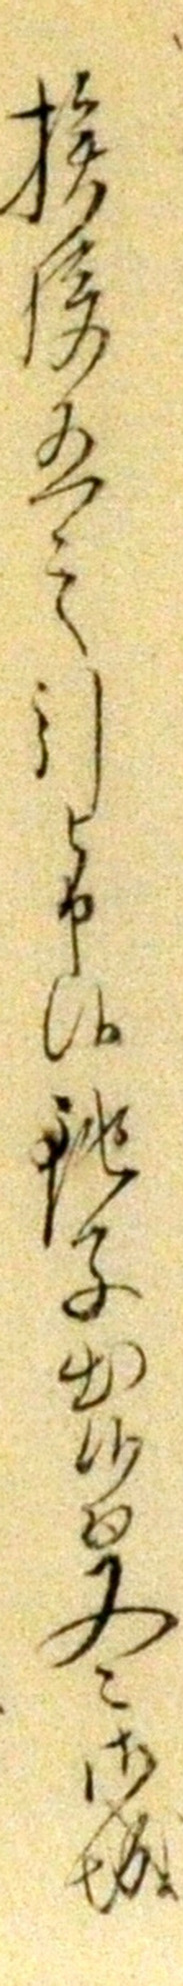挨拶有之引被申候銚子出候而又々御城
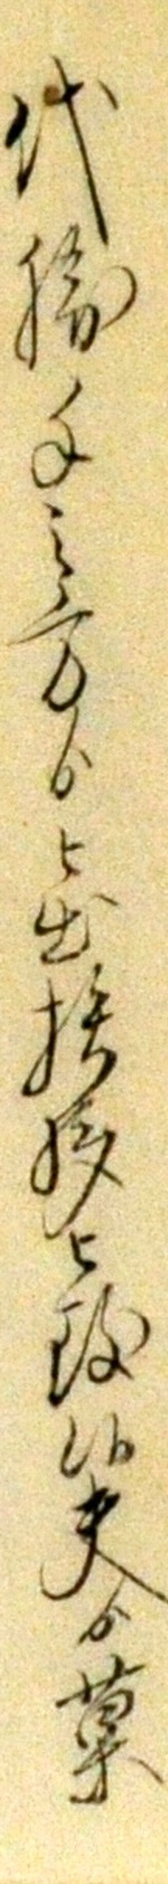代勝手之方ゟ被出挨拶被致候夫ゟ菓
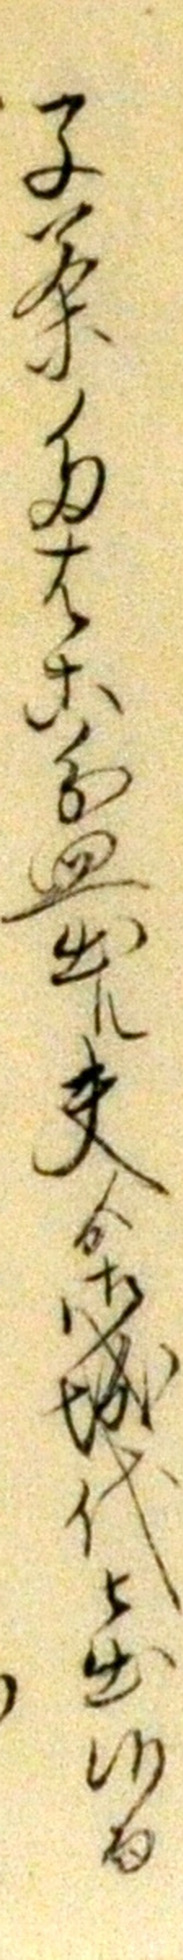子茶たはこ盆出ル夫ゟ御城代被出候而
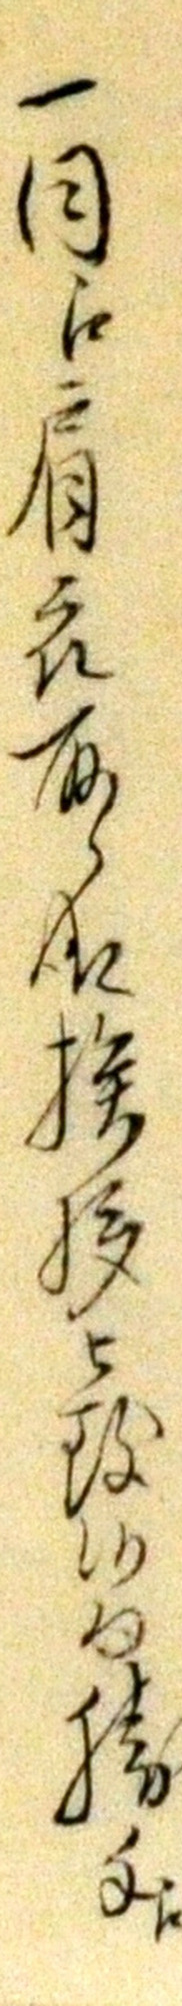一同え肩衣取候様挨拶被致候而勝手え
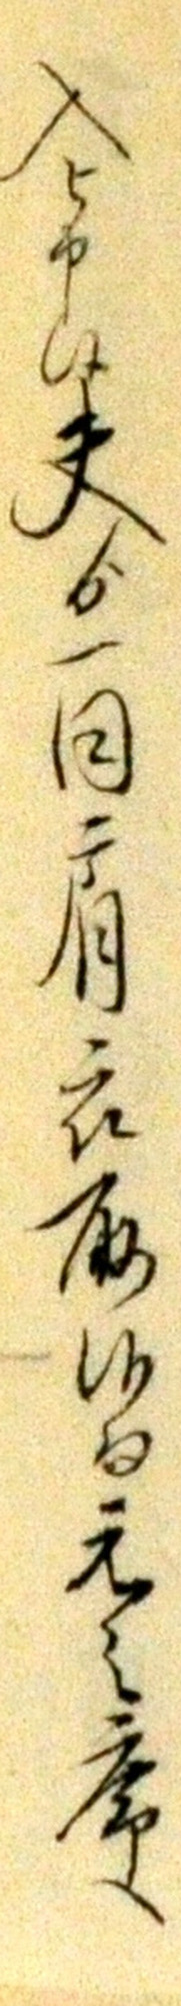入被申候夫ゟ一同肩衣取候而元之席へ
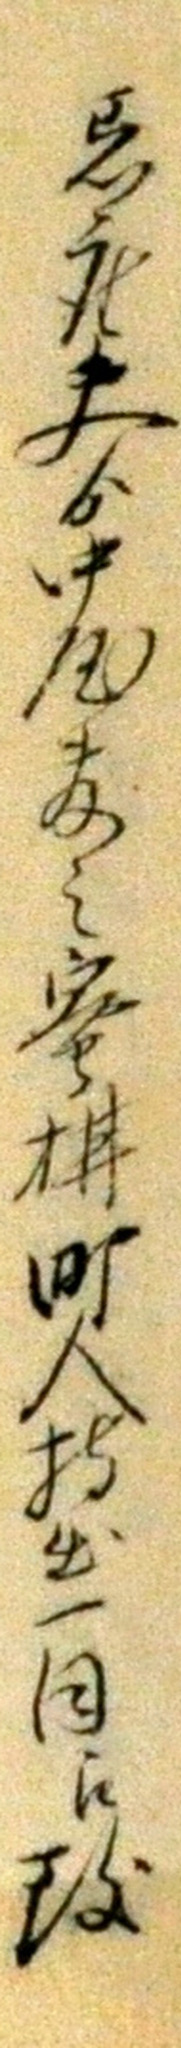着座夫ゟ中屋敷之蜜柑町人持出一同え致
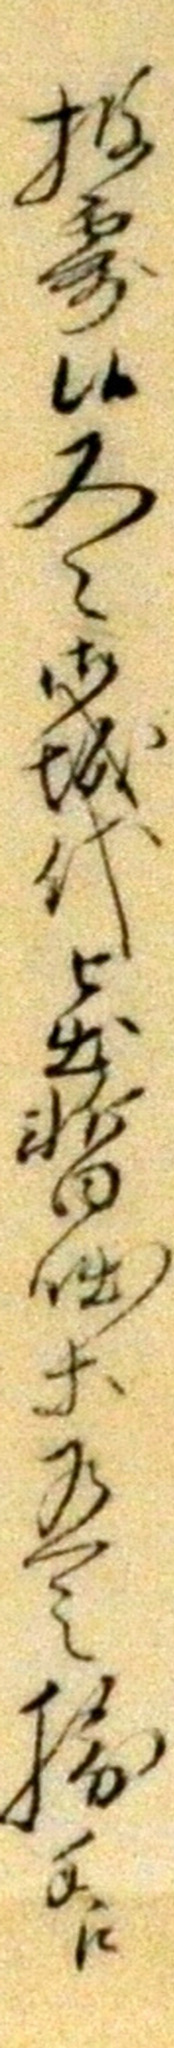披露候又々御城代被出暫咄等有之勝手え
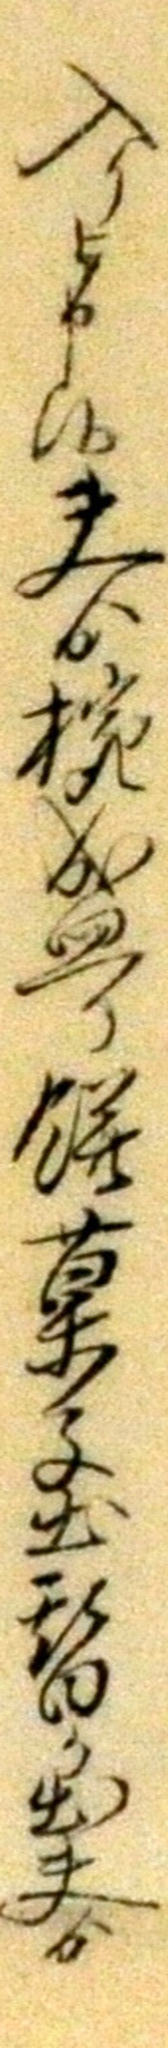入り被申候夫ゟ椀盛り餅菓子出替り出夫ゟ
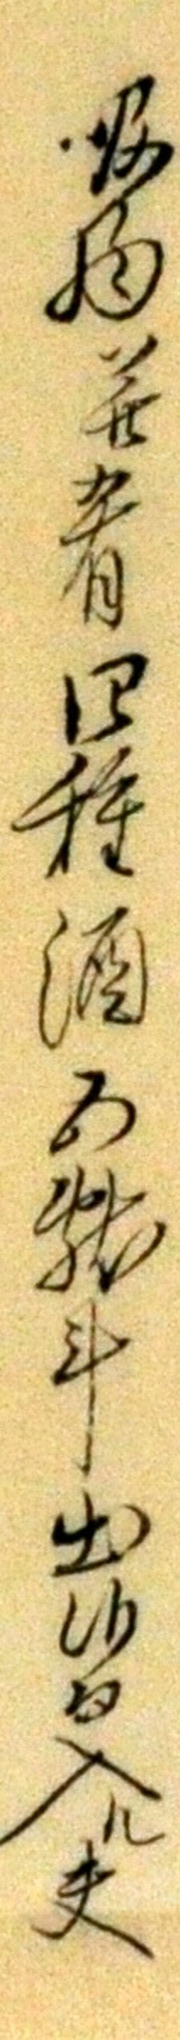吸物并肴四種酒五献計出候而入ル夫
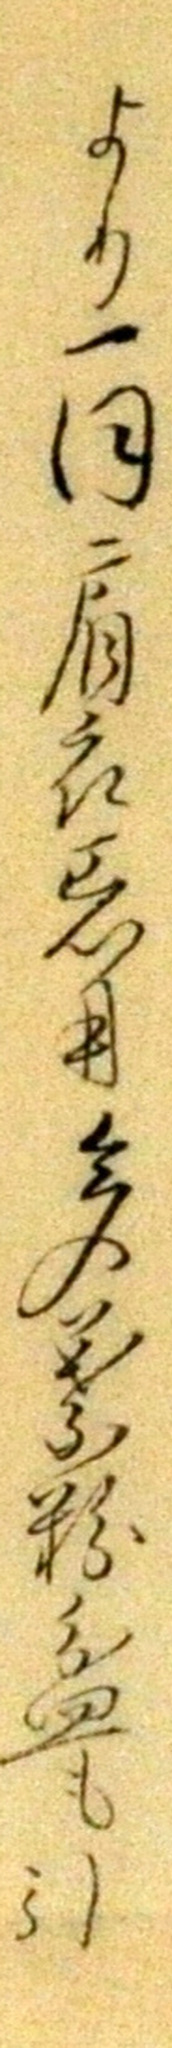より一同二肩衣着用多葉粉盆も引
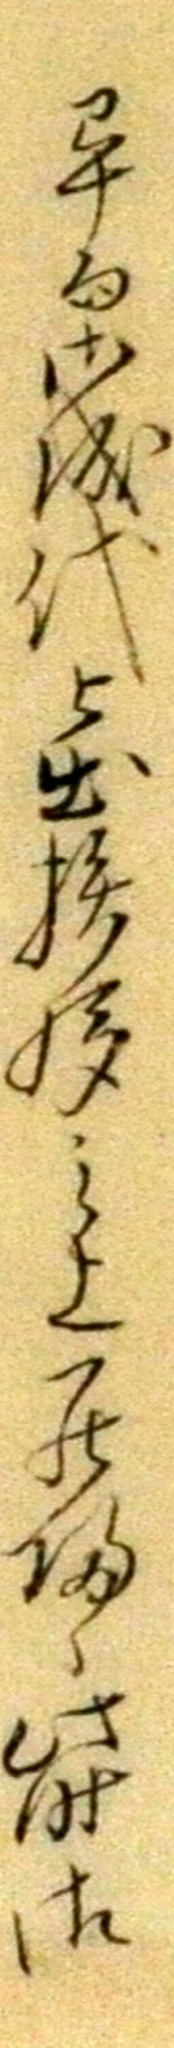畢而御城代被出挨拶之上罷帰候此時御
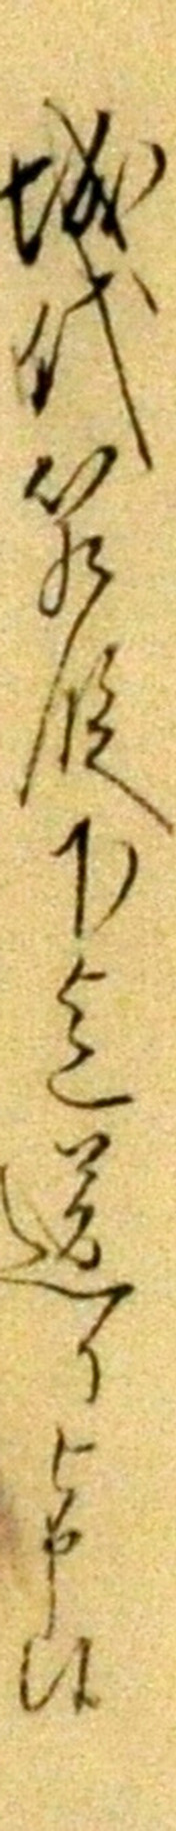城代箱段下迄送り被申候
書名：大阪加番関係諸書留〔一括〕
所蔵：伊那市立高遠町図書館・合同会社AMANE
